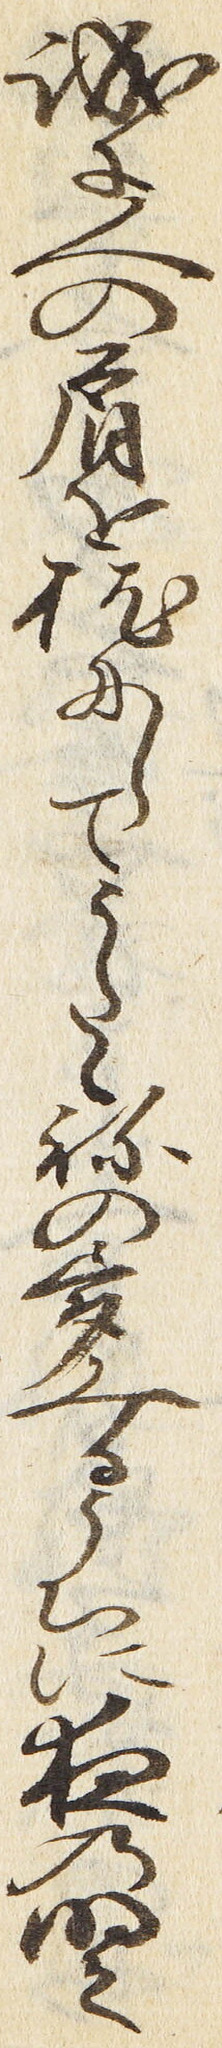誠に人の肩を枕にしてうたゝねの夢みるうちに夜の明て
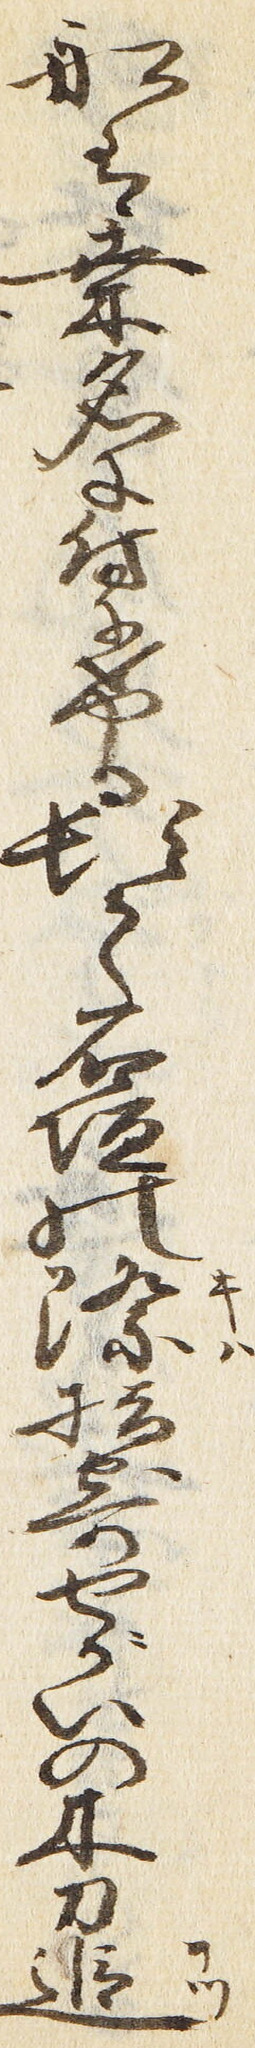船は桑名に付にける頓て石垣の際指寄せがいの木刀追
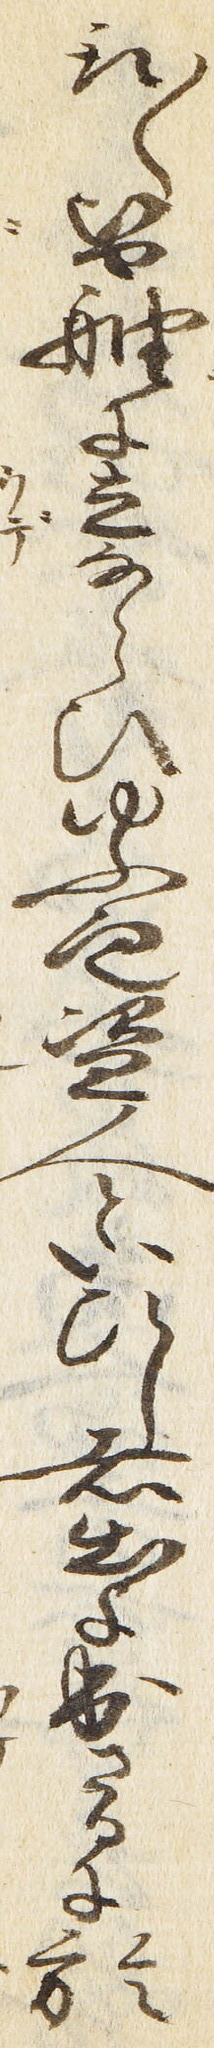取〳〵皆舳に立ならひゆふへ盗人といひし者出よ出さるに於
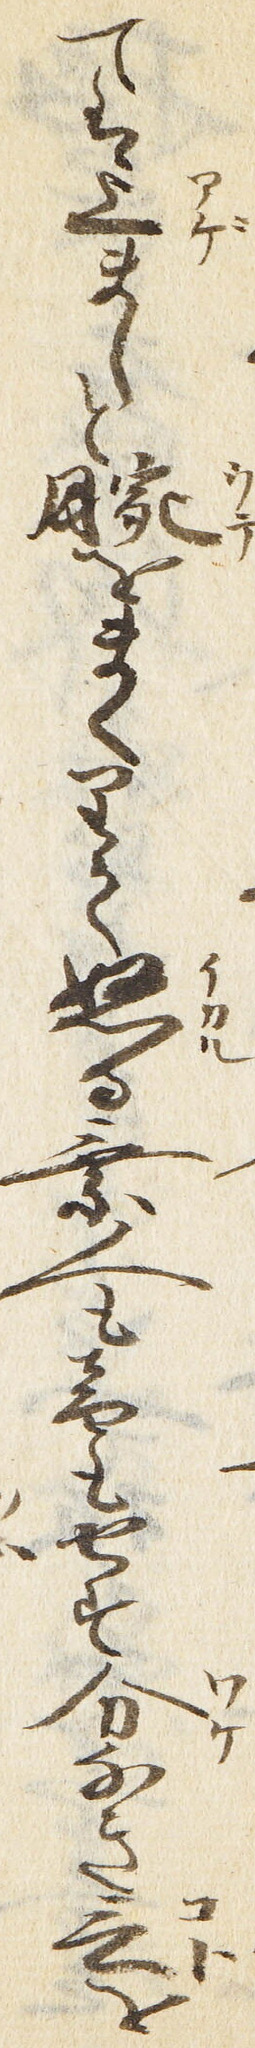ては上ましと腕をまくりて怒る乗人も音もせす分なき言を
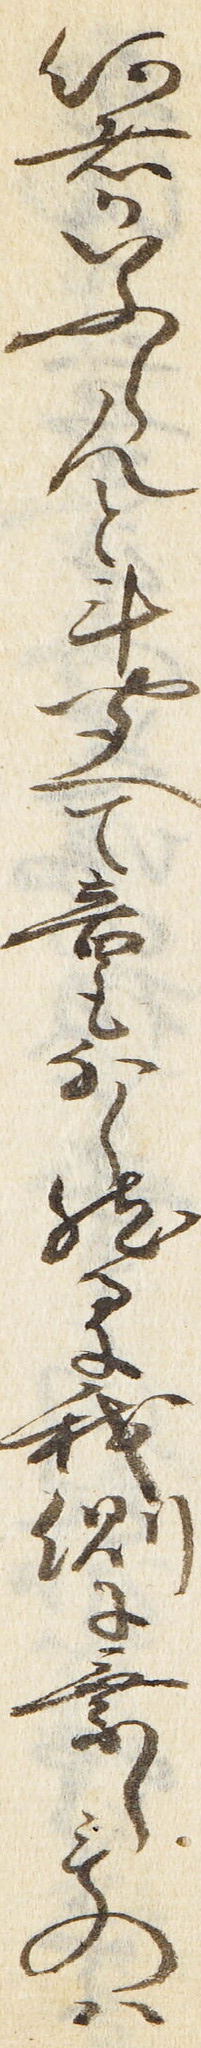何者かいふらんと計聞へて音もなし然るに我側に乗しものは
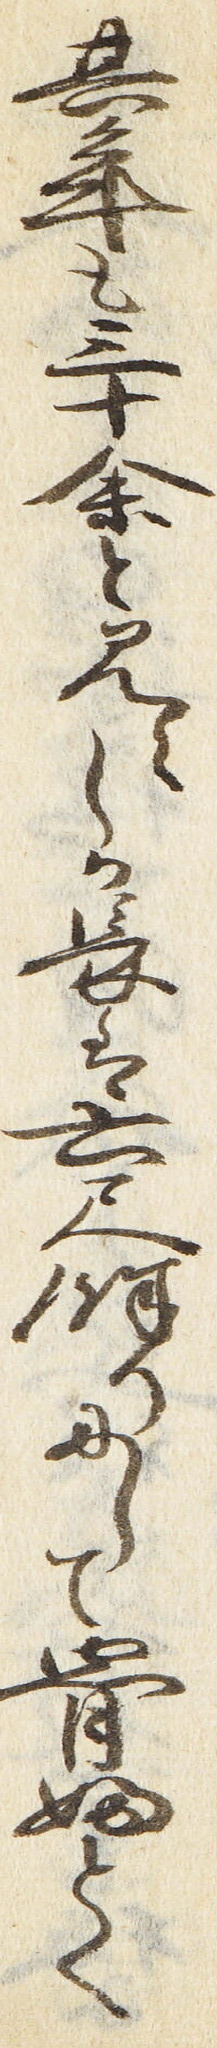其年も三十余とみえしか長は六尺余りにして骨ふとく
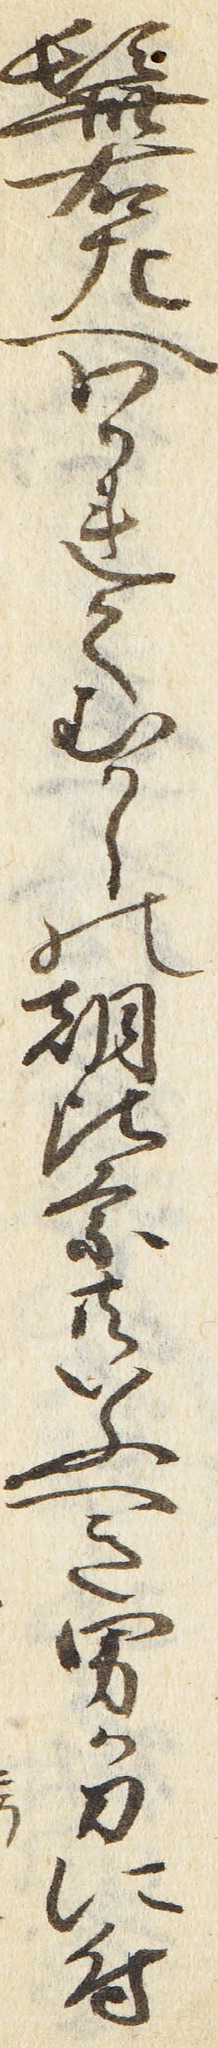髭右左へわかれてむかしの朝比奈共いふへき男か刀に付
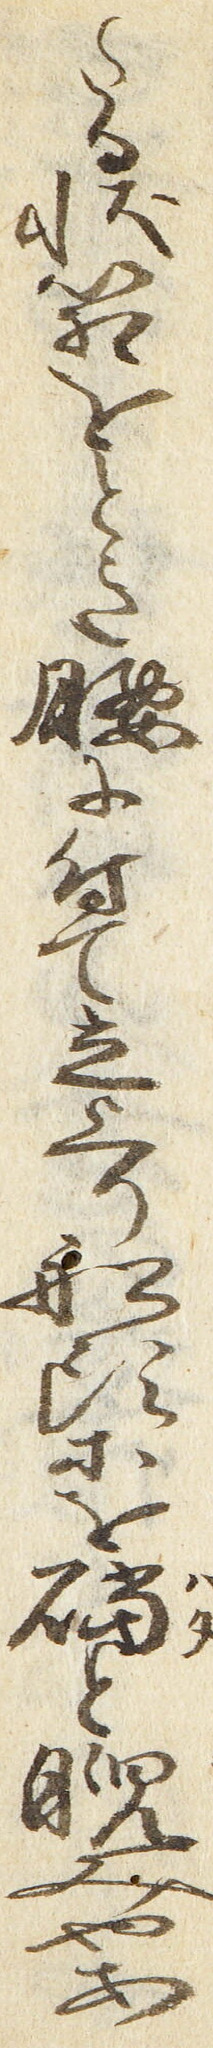たる状箱をとき腰に付て立上り船頭等を礑と睨みやあ

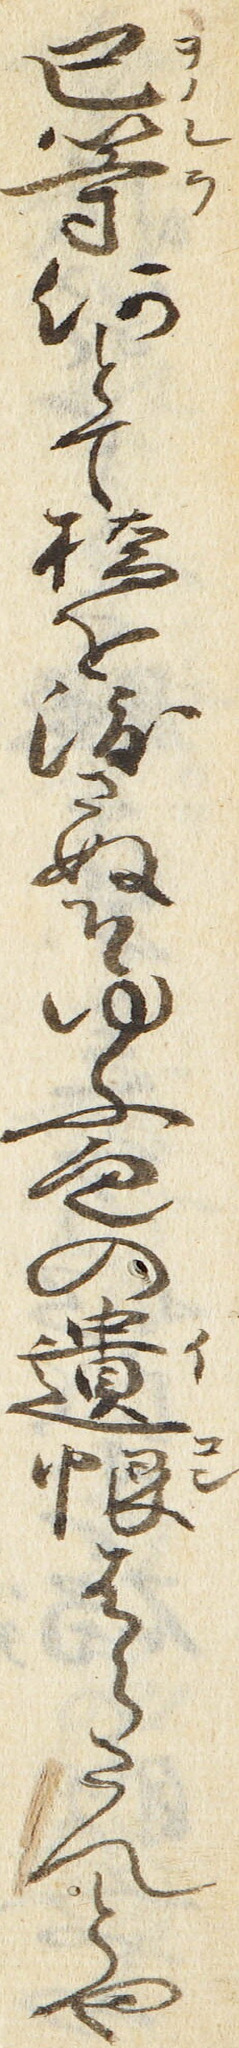己等何とて橋を渡さぬそゆふへの遺恨はらさんとや
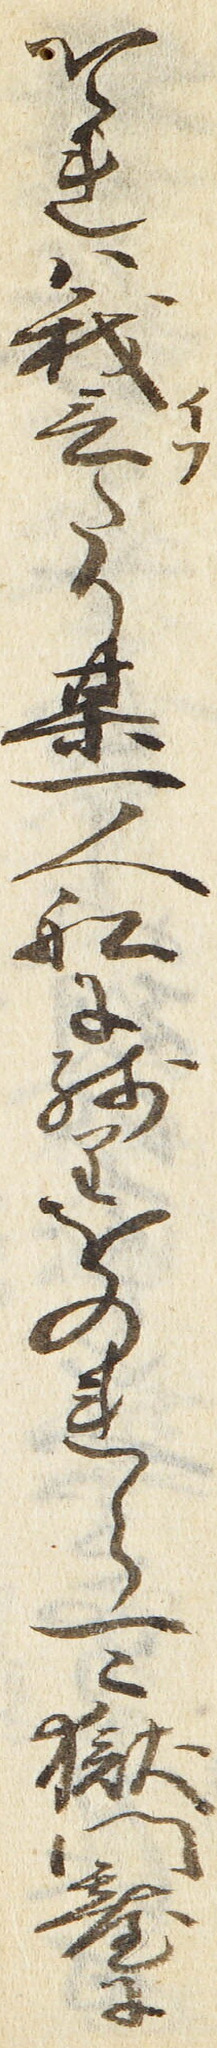それは我言たり某一人船に残りをのれら一々獄門産に
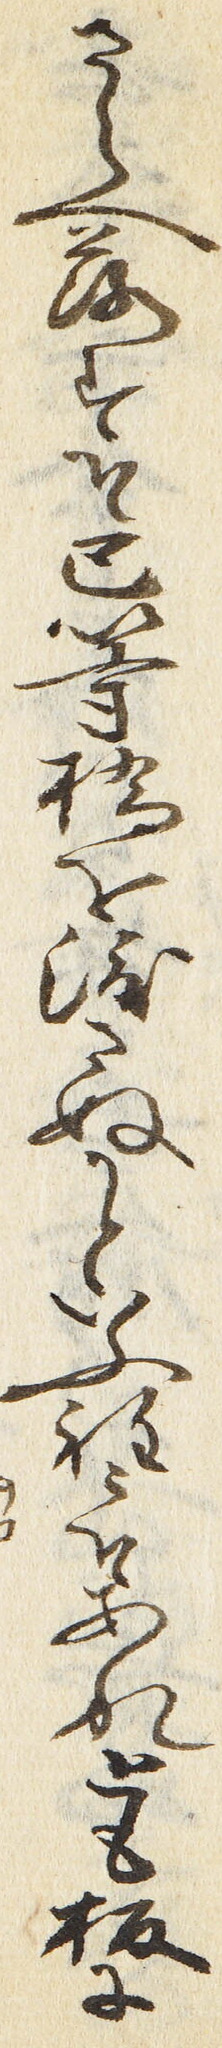さらへ落すそ己等橋を渡さぬかといふ程こそあれとも板に
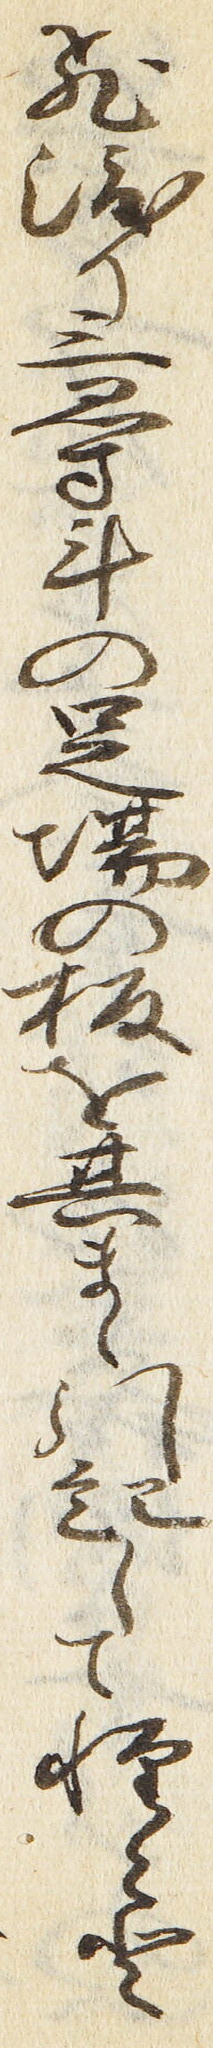飛渡り三尋計の足場の板を其まゝ引起して軽々と
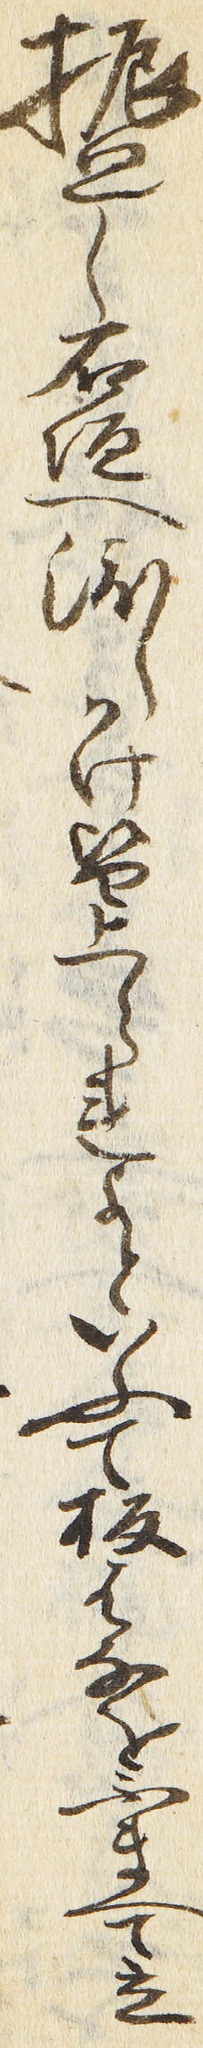振廻し石垣へ渡しかけ皆上られよといふて板はなをふまへて立
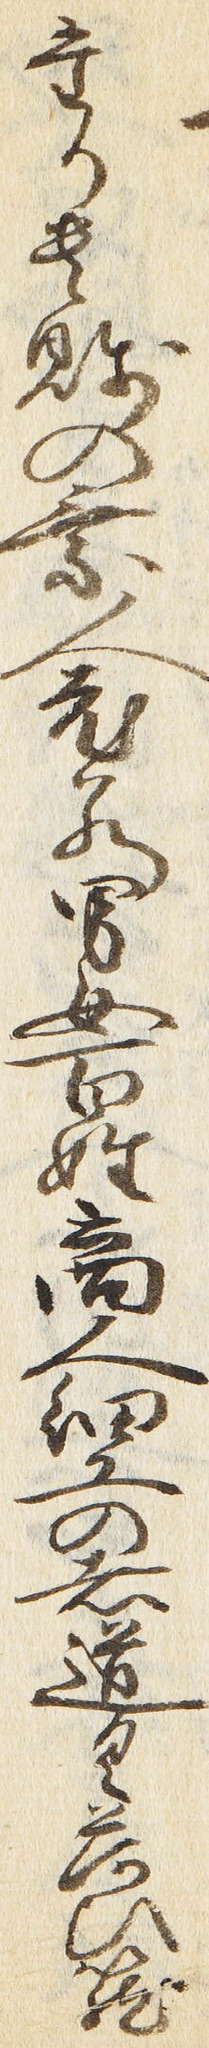たり貴賤の乗人老若男女百姓商人細工の者道具荷ひ籠
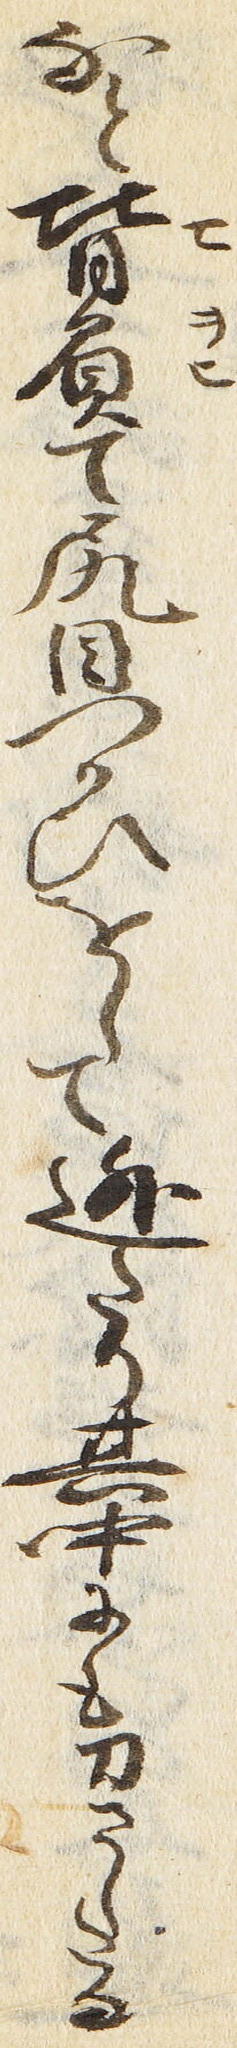なと背負て尻目つかひをして逃たり其中にも刀さしたる
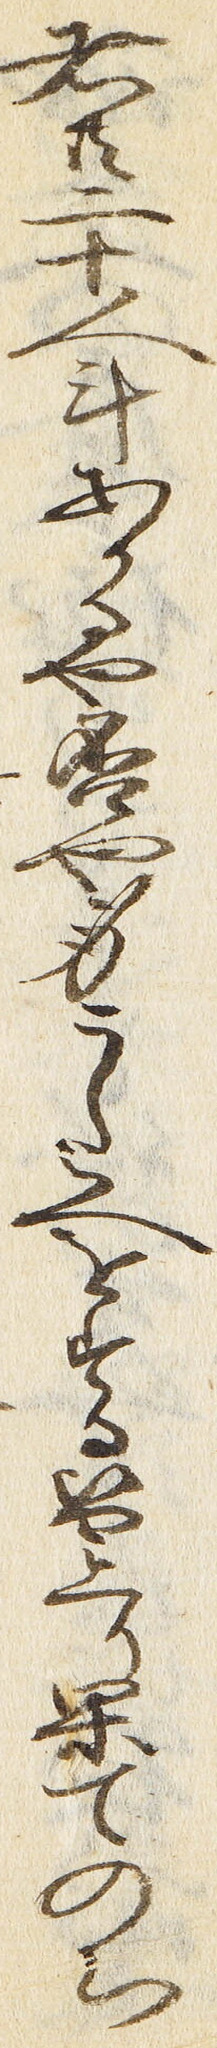者共二十人計あかるや否や身こしらへをする皆上り果てのち
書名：海陸世話日記
